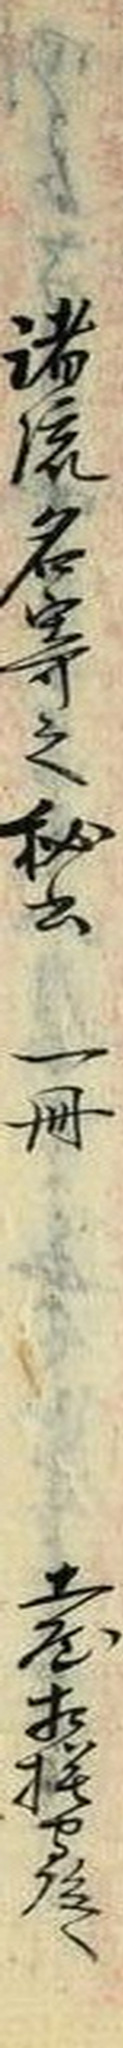諸流名寄之秘書一冊土屋相模守殿へ
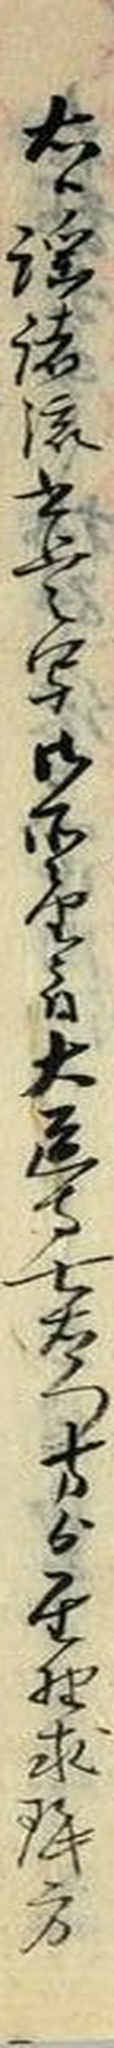右ハ謡諸流書上之写御所望ニ付大道寺七右衛門方ゟ星野求珉方
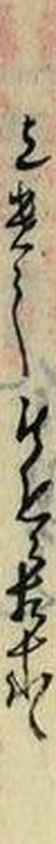迄遣之被進ニ相成候
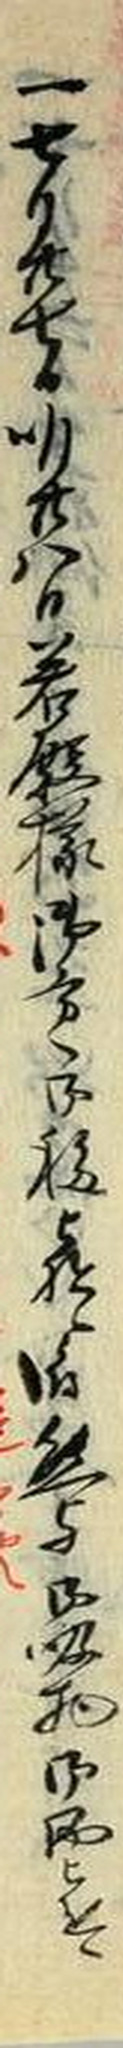一七月廿七日明廿八日若殿様御方へ御移被遊候ニ付態与御吸物御酒被進候
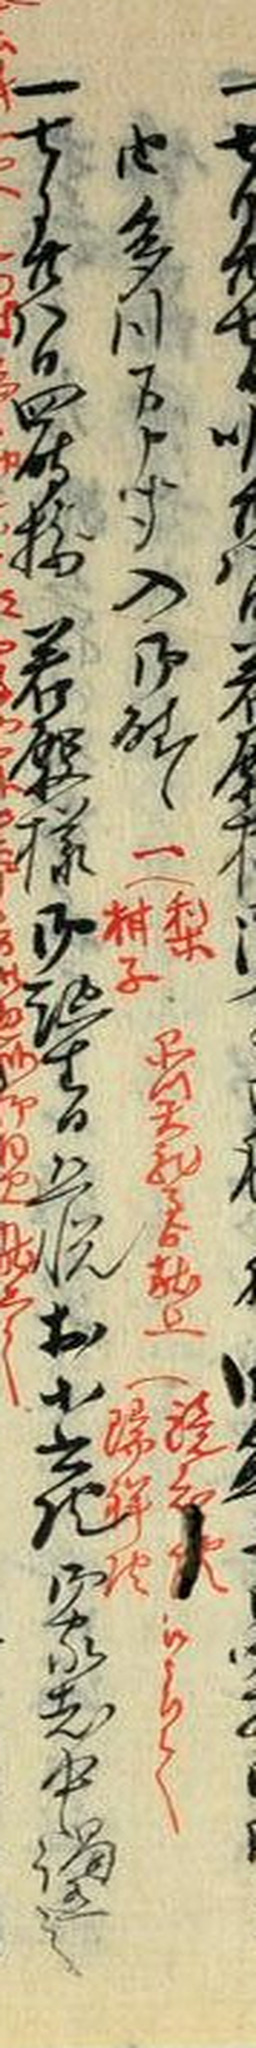一七月廿八日四時揃若殿様御誕生日恐悦於小書院御家老中謁有之
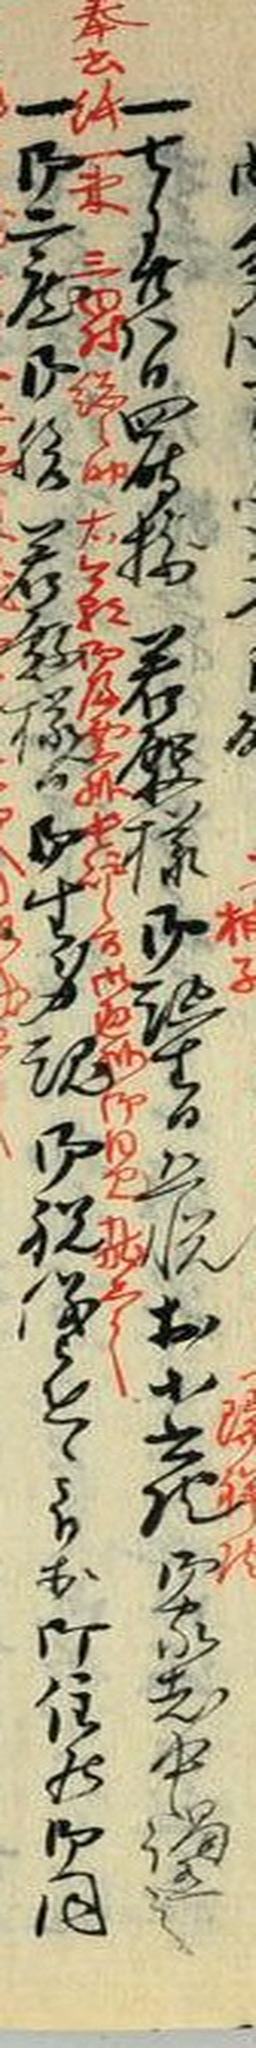一御二度御膳若殿様ゟ御生身魂御祝儀被進候ニ付於御住居御同
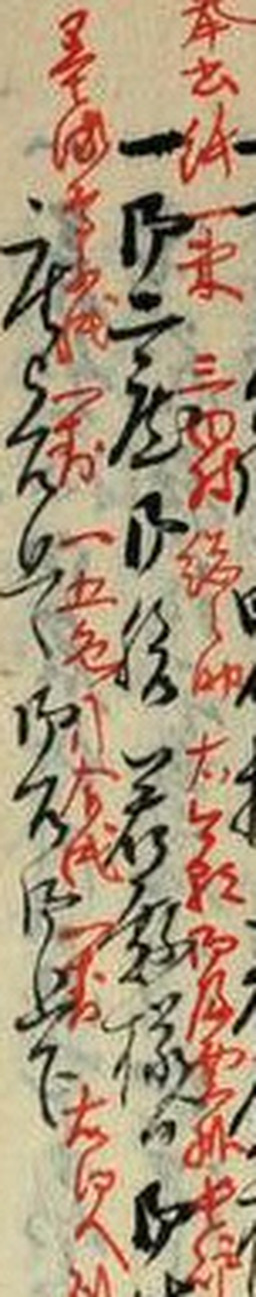座被召上候御召御上下
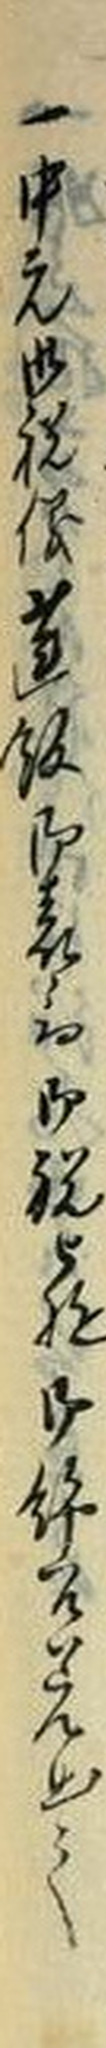一中元御祝儀蓮飯御表ニ而御祝被遊御飾召差出之
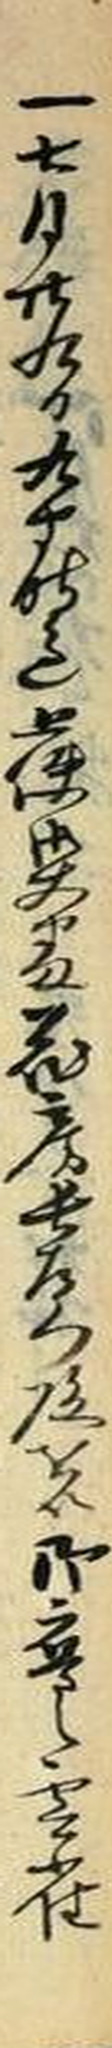一七月廿九日九半時過上使御使番花房長左衛門殿を以御鷹之雲雀
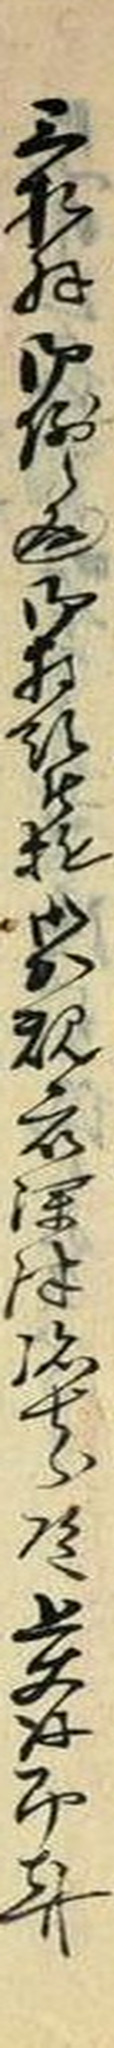三拾羽御例之通御拝領被遊御加規衆深津弥十郎殿上使後即刻
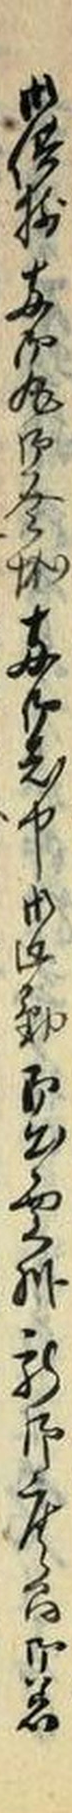御供揃両御丸御登城両御老中御廻勤御出殿掛新御座之間御着
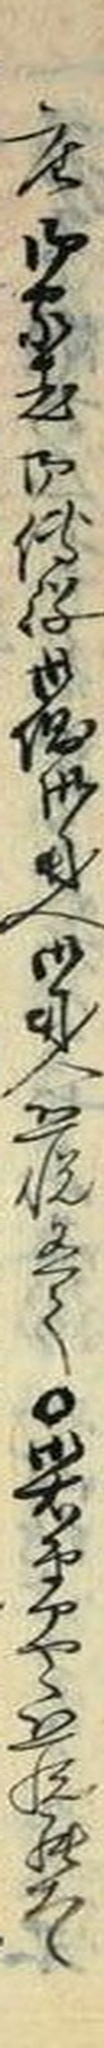座御家老御傅役御側御用人御用人恐悦有之○御右筆部やへ恐悦罷出候
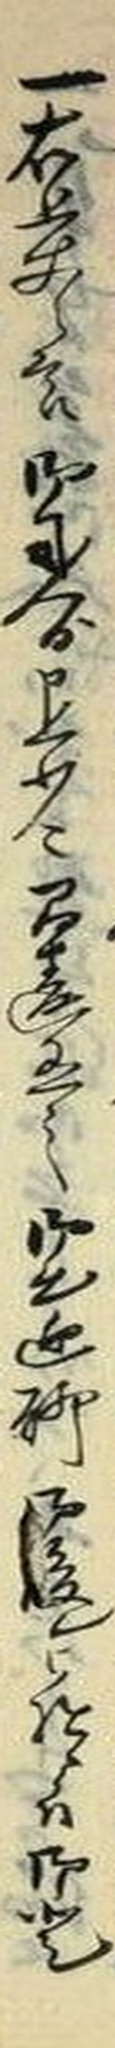一右上使之節御用人ゟ申上少々間違有之御出迎聊御後レ被遊候ニ付御登
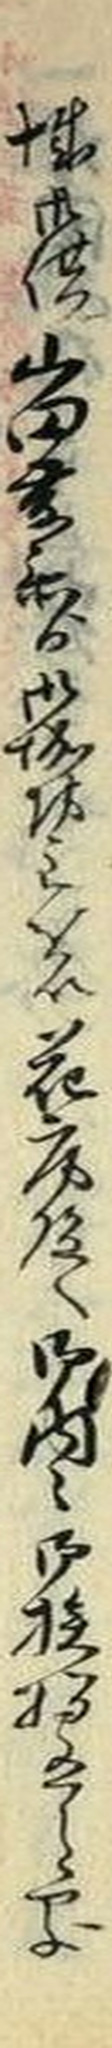城御供山田藤兵衛ゟ御城坊主を以花房殿へ御内々御挨拶有之候処
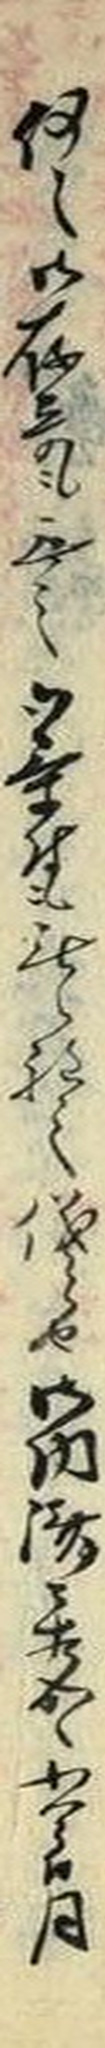何之御存寄も無之御気付も無之程之儀ニ候由御内済ニ相成候右ニ付月
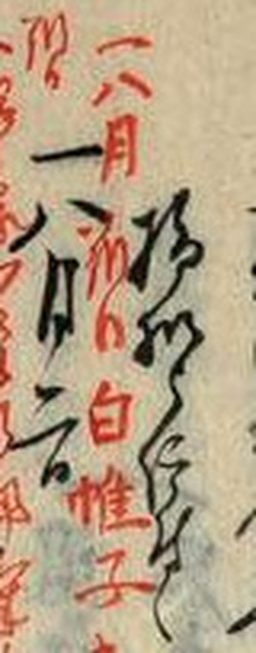一八月二日
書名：少傅日録抄（斉承付側向頭取日記、在府）
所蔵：福井県文書館 Fukui Prefectural Archives
